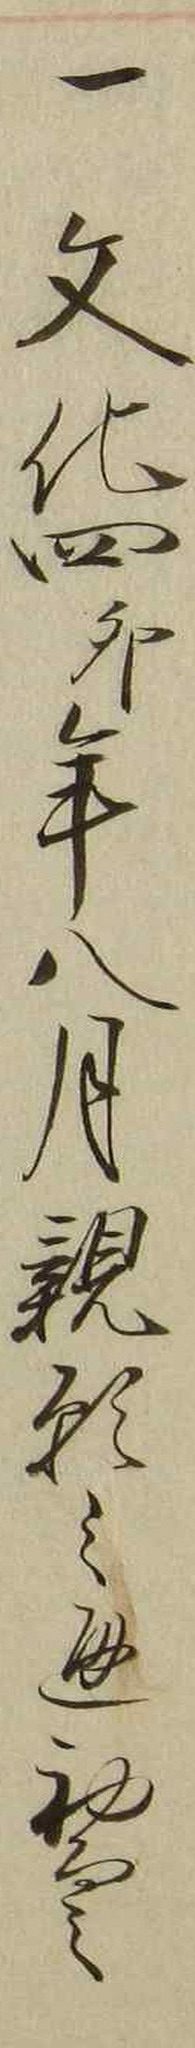一文化四卯年八月親願之通初而之
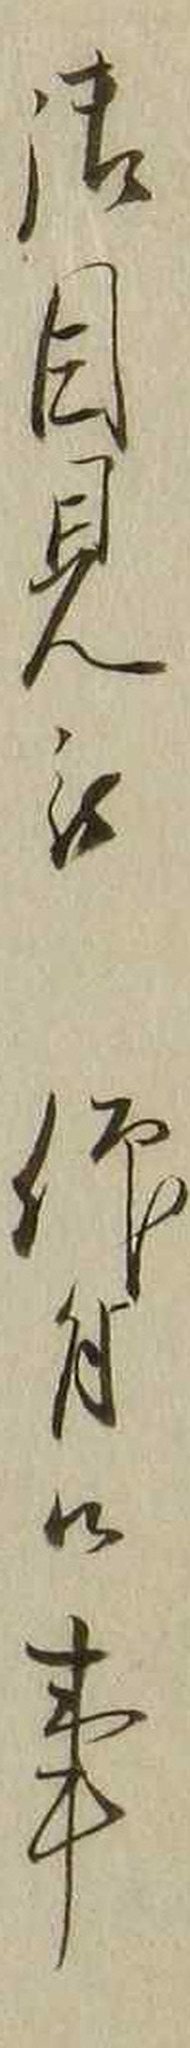御目見被仰付候事
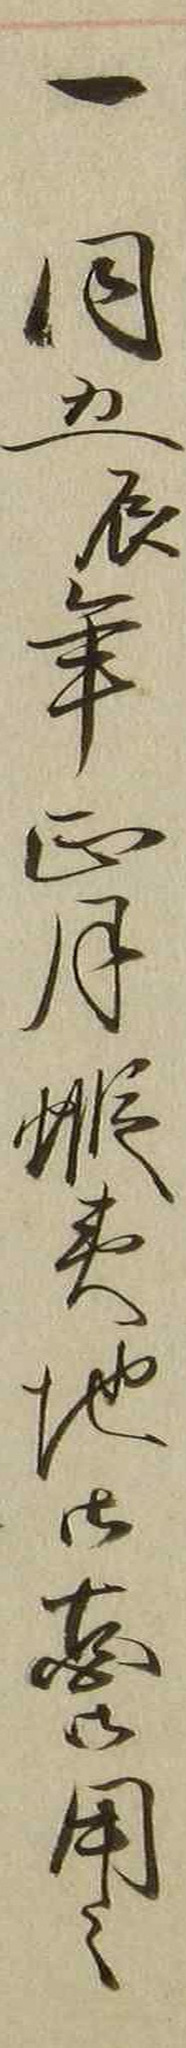一同五辰年正月蝦夷地御固御用之
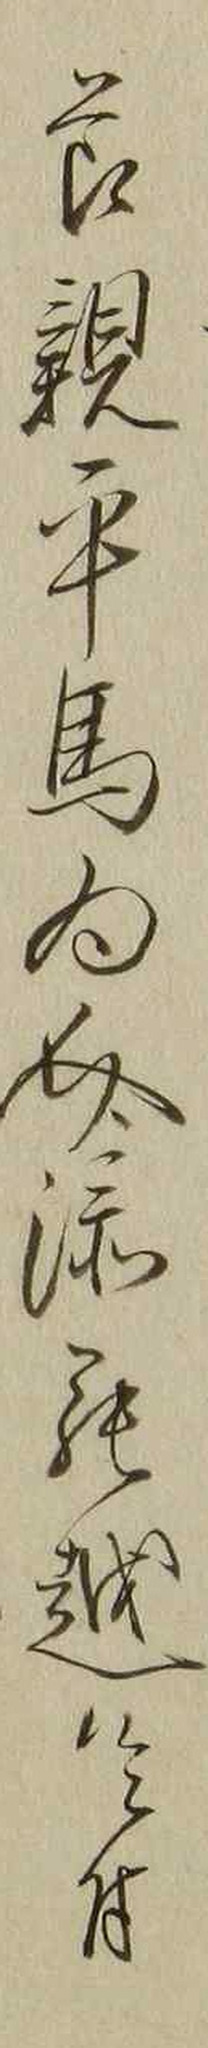節親平馬為介添罷越候に付
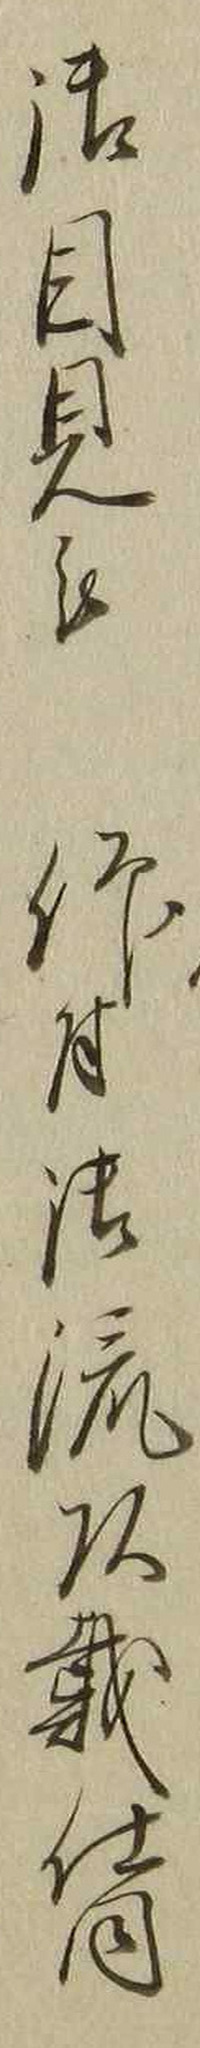御目見被仰付御流頂戴仕同
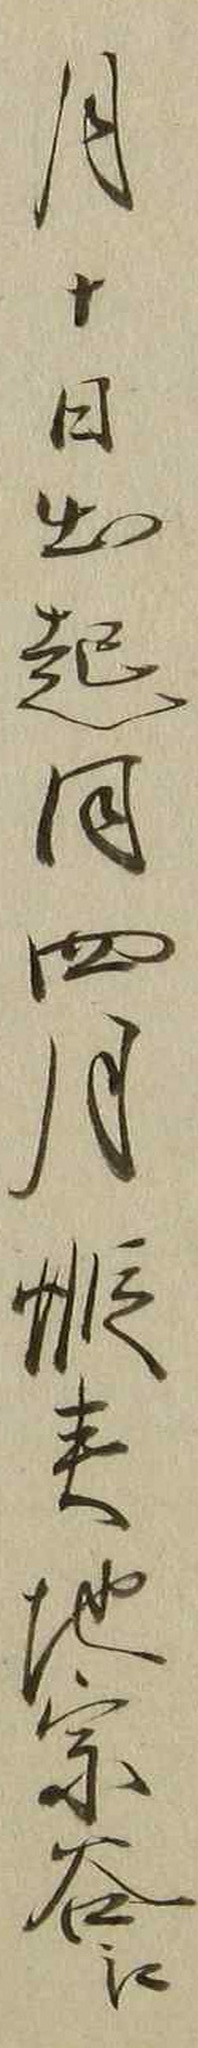月十日出起同四月蝦夷地宗谷江
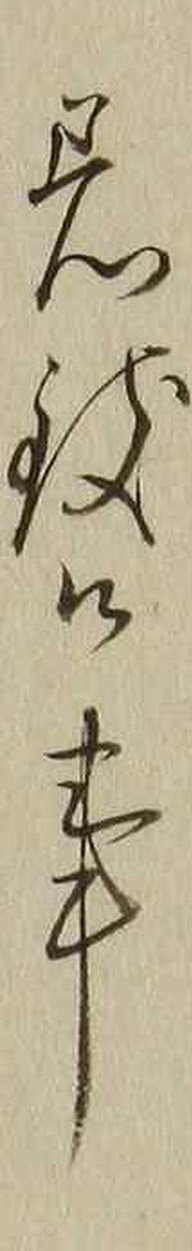着致候事
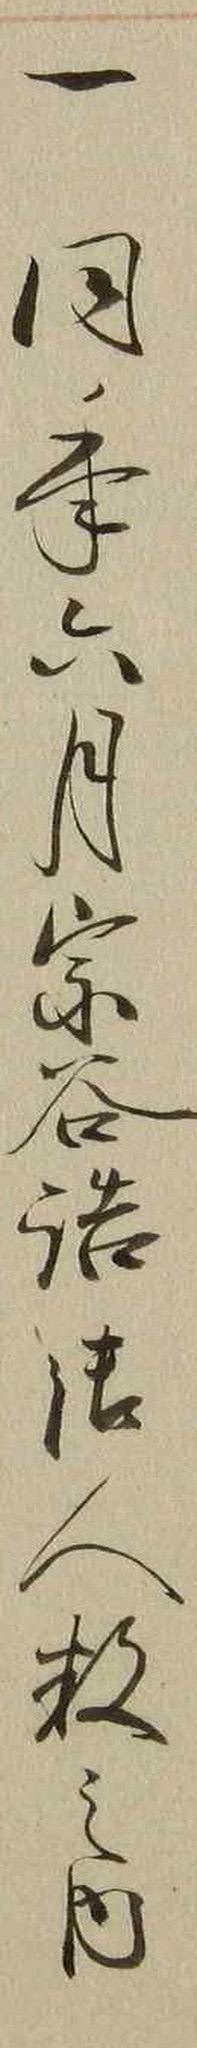一同年六月宗谷詰御人数之内
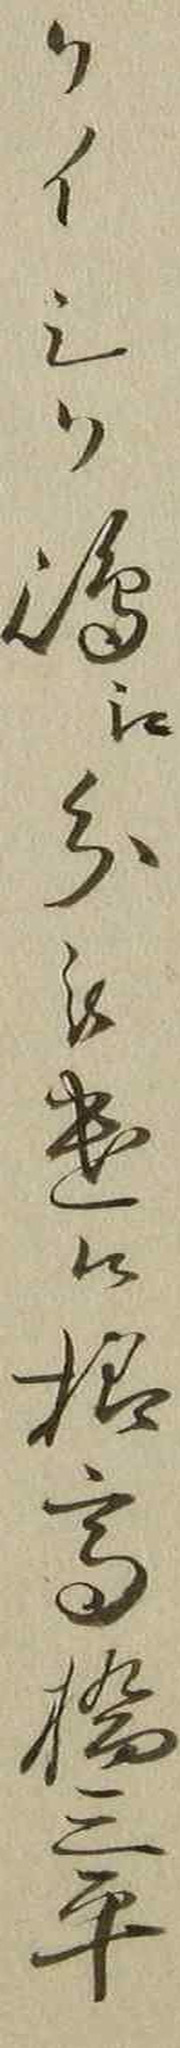りイシリ嶋江分被遣候様高橋三平
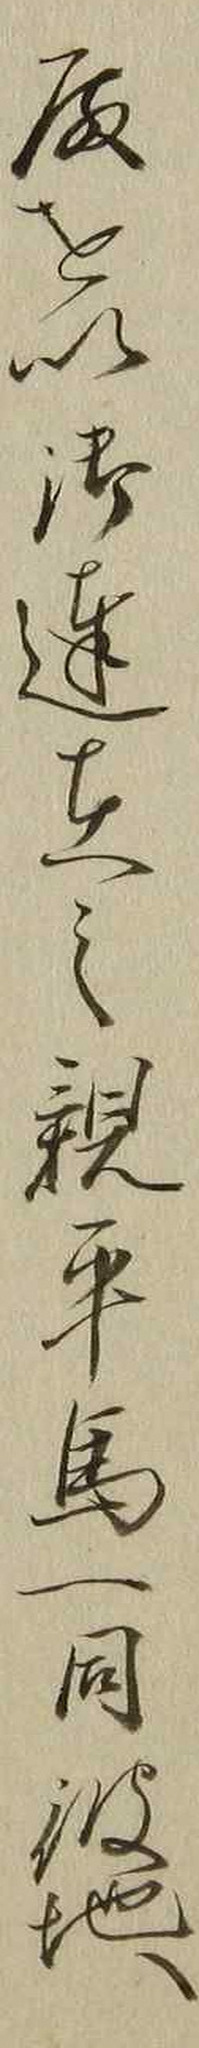殿を以御達在之親平馬一同彼地へ
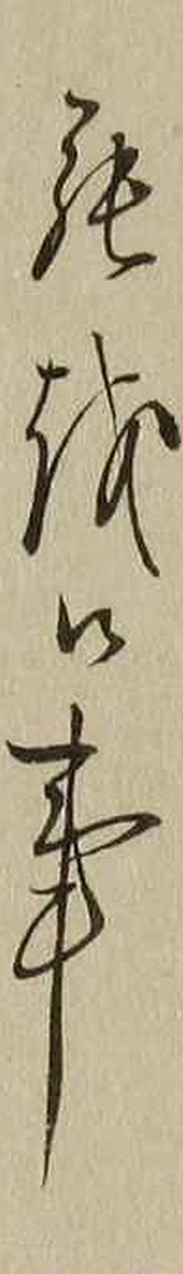罷越候事
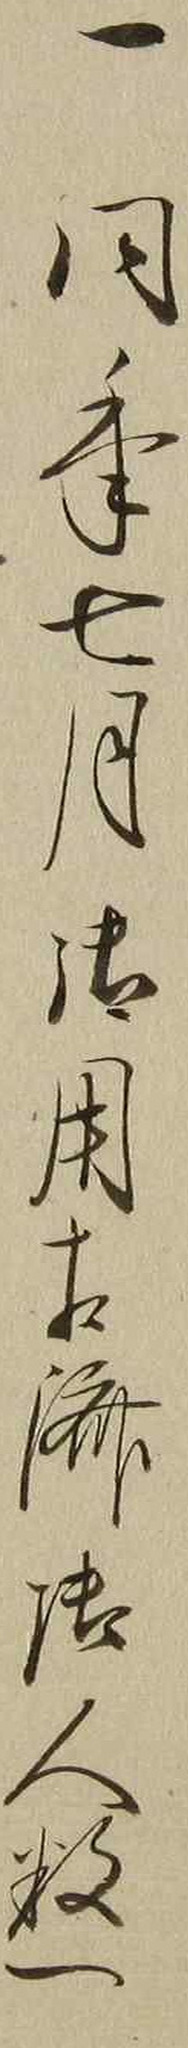一同年七月御用相済御人数一
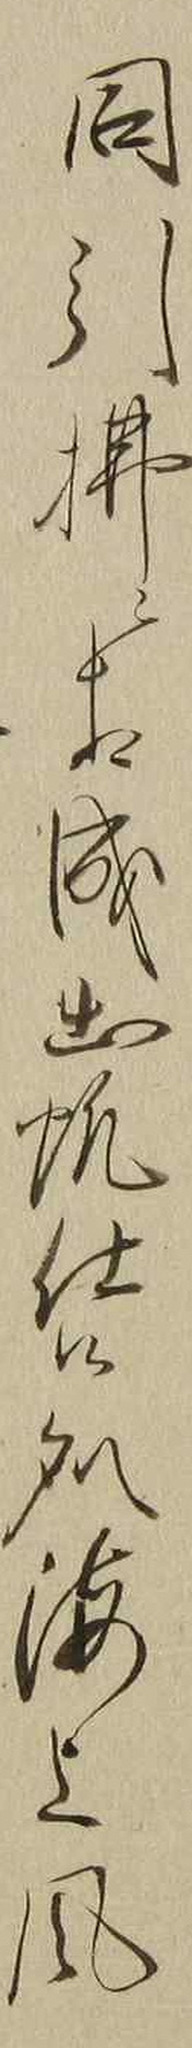同引払に相成出帆仕候処海上風
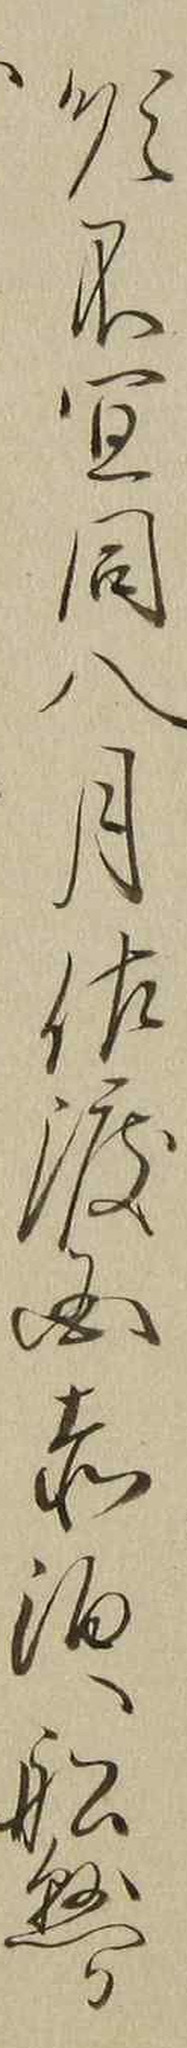順不宜同八月佐渡国赤泊へ船懸り
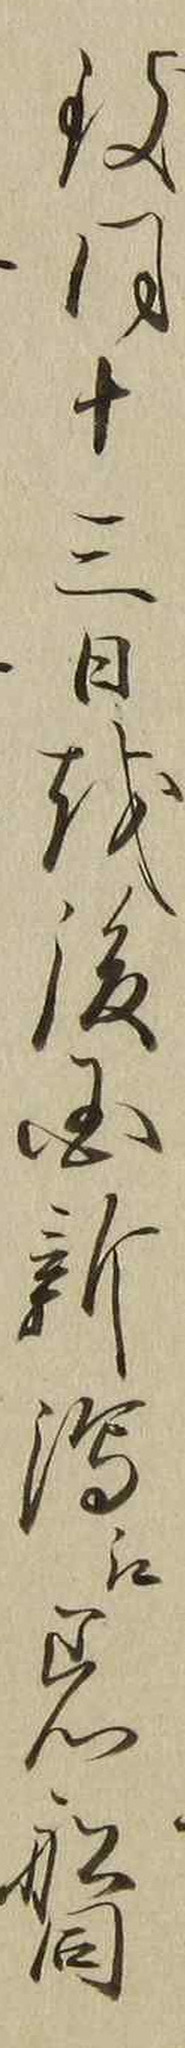致同十三日越後国新潟江着船同
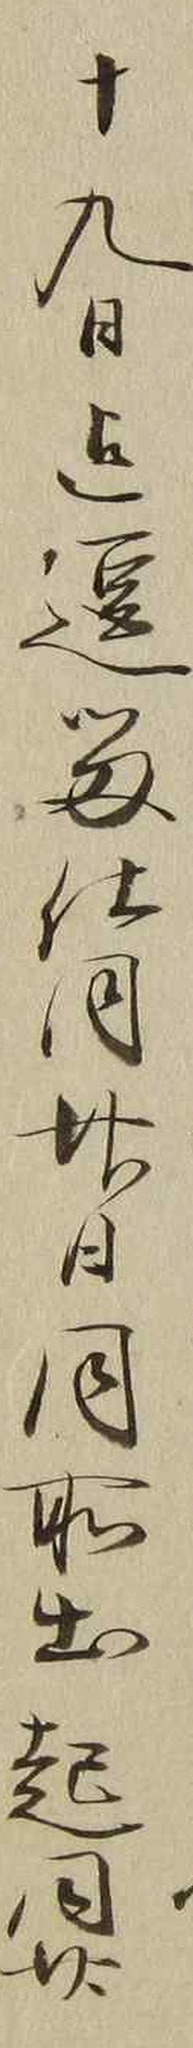十九日迄逗留仕同廿日同所出起同廿
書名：諸士系譜　巻之103　か之部11
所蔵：会津若松市立会津図書館
